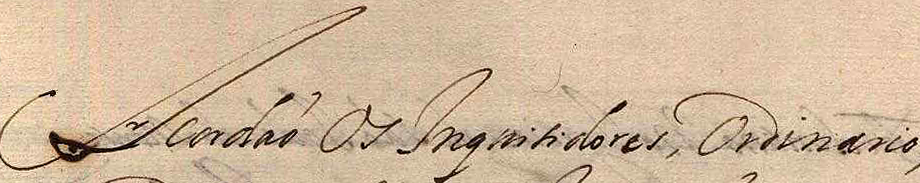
Acordaõ Os Inquisidores, Ordinario,
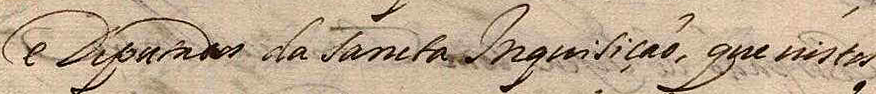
e Deputados da Sancta Inquisição, que uistos
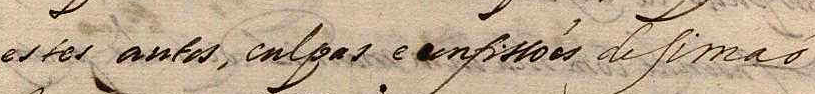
estes autos, culpas e confissões de Simão
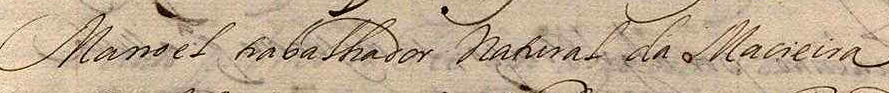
Manoel trabalhador natural da Macieira
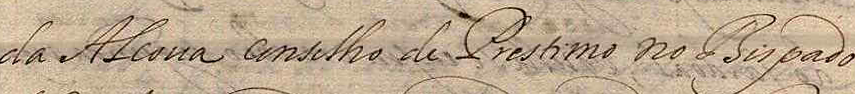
da Alcoua conselho de Prestimo no Bispado
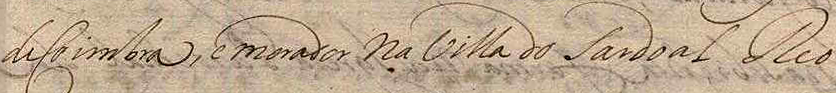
de Coimbra, e morador na villa do Sardoal Reo
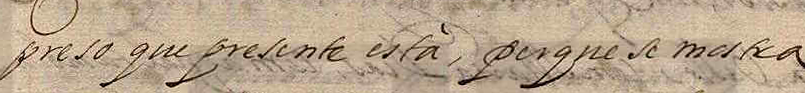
preso que presente está, porque se mostra
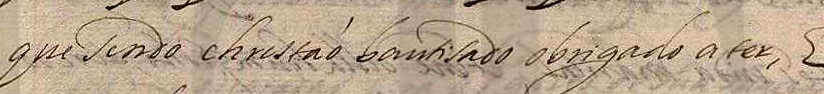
que sendo christaõ bautisado obrigado a ter, E
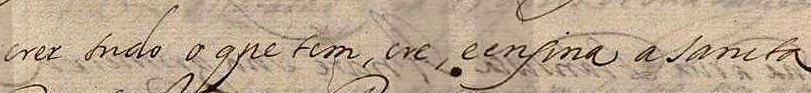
crer tudo o que tem, cre, e ensina a sancta
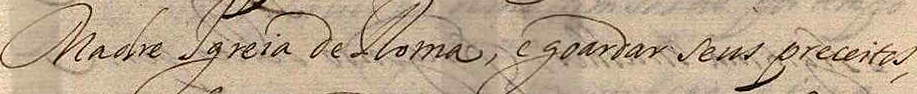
Madre Igreia de Roma, e goardar seus preceitos,
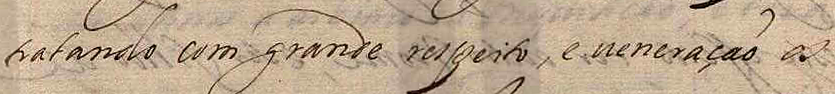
tratando com grande respeito, e ueneração os
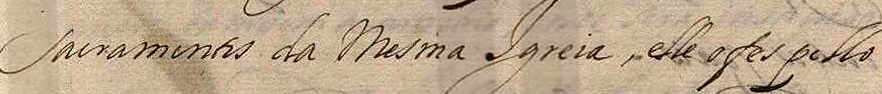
Sacramentos da mesma Igreia, elle o fes pello
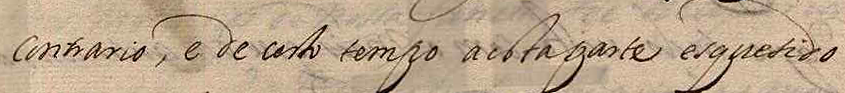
contrario, e de certo tempo a esta parte esquesido
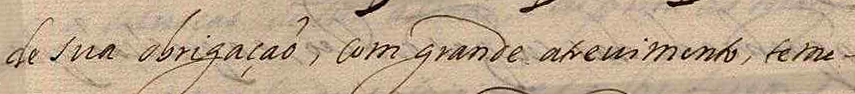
de sua obrigaçaõ, com grande atreuimento, teme
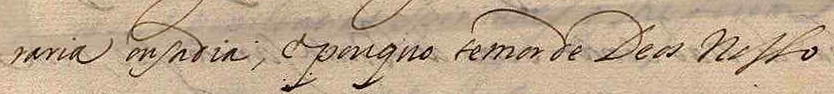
raria ousadia, e pouquo temor de Deos Nosso
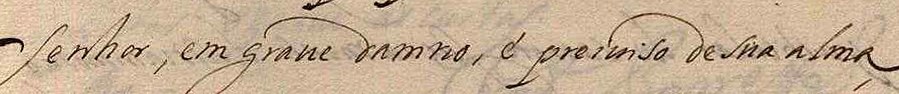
Senhor, em graue damno, E preiuiso de sua alma,
